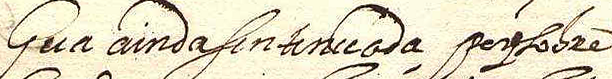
Qua ainda sentenciada, porq̄ sobre
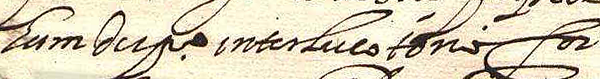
hum desp.o interlocutorio foi
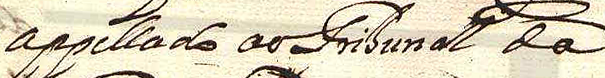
appellado ao Tribunal da
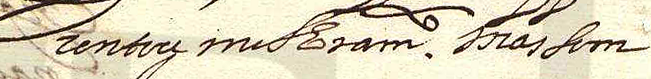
zentou melhoramto. mas sem
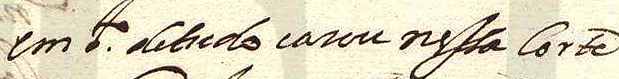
em t.o de tudo cazou nessa Corte
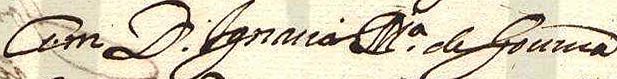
Com D. Ignacia Ma. de Gouuea
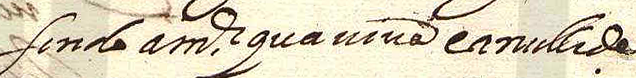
Sendo a m.er qua uiua e a nullid.e
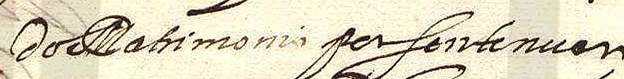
do Matrimonio por Sentenciar,
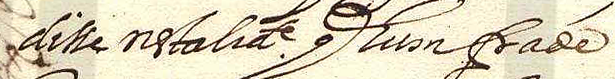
disse nesta Cid̄.e q̄ hum frade
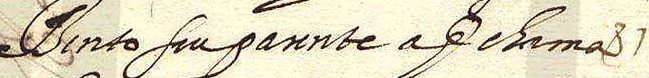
Bento seu parente a q̄ chamaõ
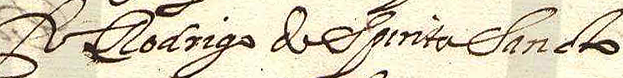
Fr Rodrigo do Spirito Sancto
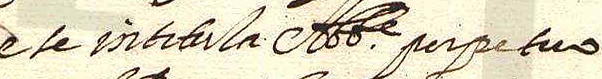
e se intitula Abb.e perpetuo
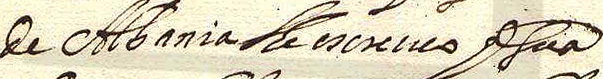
de Albania lhe escreueo q̄ sua
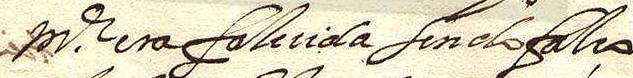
m.er era falecida sendo falço
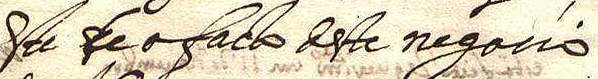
este he o facto deste negoçio
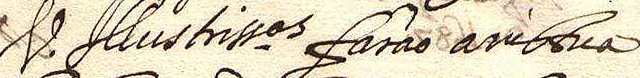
V. Illustriss.as farão a iustica
